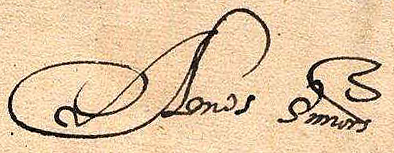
Ilmos Snnor̄s
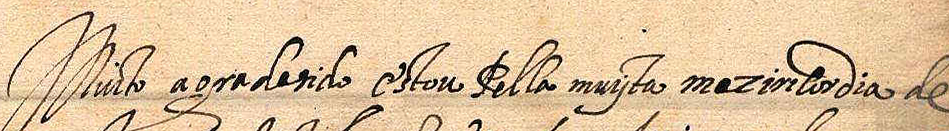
Muito agradesido estou Pella muyta meziricordia de
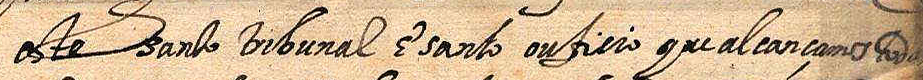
este santo tribunal E santo ouficio que alcançamos todos
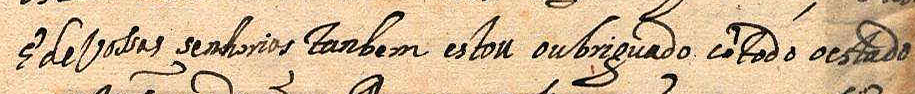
E de Vossas senhorias tanbem estou oubriguado cō todo o estado
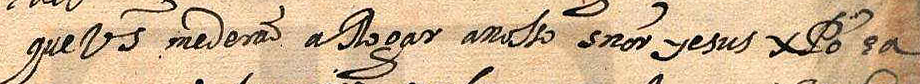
que Vs̄ me derão a Rogar a nosso snor̄ Jesus xPō E a
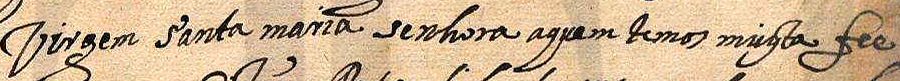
Virgem santa maria senhora a quem temos muyta fee
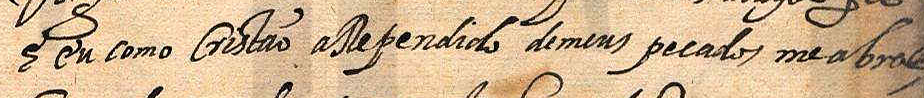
E eu como Cristaõ aRependido de meus pecados me abraço
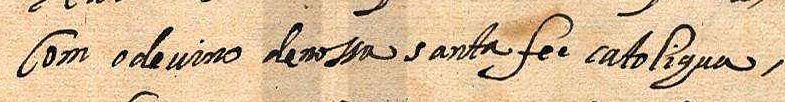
Com o deuino de nossa santa fee catoliqua
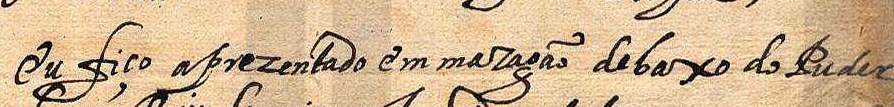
Eu fico aprezentado em mazagão debaxo do Puder
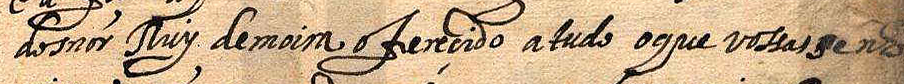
do snōr Ruy de moira oferecido a tudo o que vossas senho
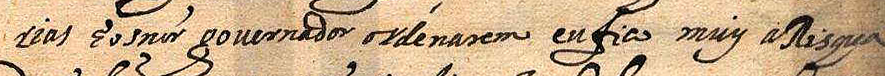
rias E o snor̄ gouernador ordenarem eu fico muy aRisqua
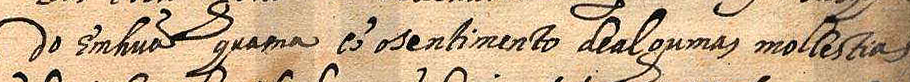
do Em huā quama cō o sentimento de algumas mollestias
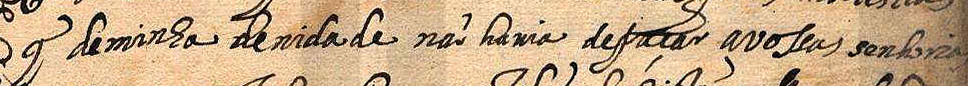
q̄ de minha denidade naõ hauia de paçar a vossas senhorias
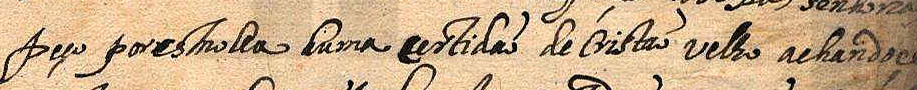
peço por esmolla huma certidaõ de cristaõ velho achandoçe
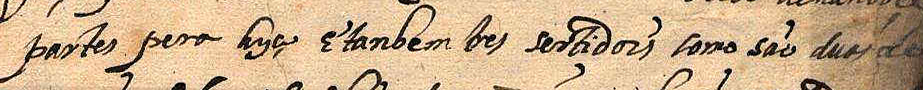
partes pera hyço E tambem tres sertidoẽs como saõ duas de
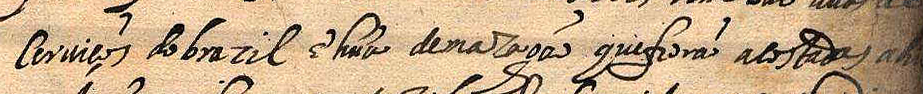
ceruiços do brazil E huā de mazagaõ que foraõ acostadas ahi
